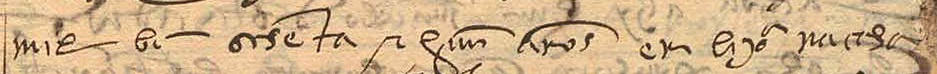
mil bc sesēta e hūu ānos em lixa na casa
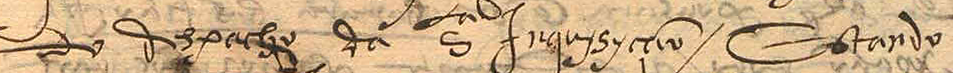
do despacho da sta Jnquysyção / Estando
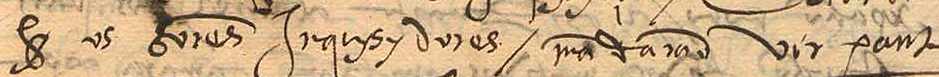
hy os s̄ores Jnquysydores / mādarão vir ꝑante
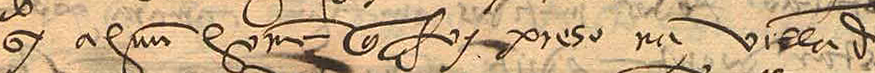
sy a hūu homē q̄ foy preso na villa de
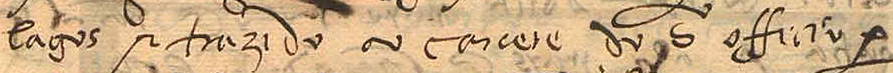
lagos e trazido ao carcere do sto officio ꝑ
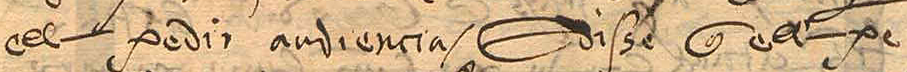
elle pedir audiencia / E disse q̄ elle pe
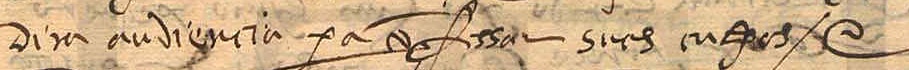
dira audiencia ꝑa cōfessar suas culpas / e
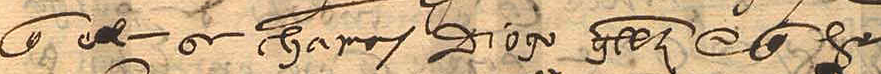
q̄ elle se chama / Diogo ḡllz e q̄ he
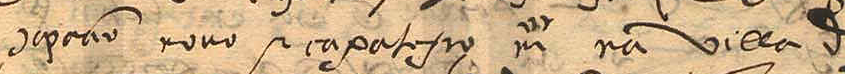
xpaão nouo e çapateyro mor na villa de
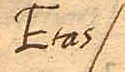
Etas /
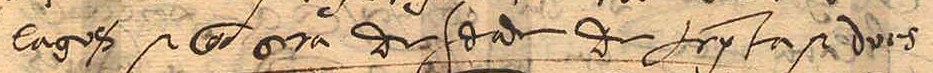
lagos e q̄ sera de Jdade de trȳta e does
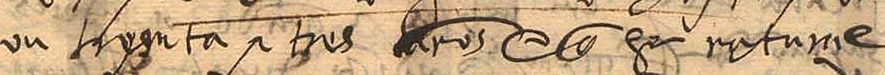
ou trynta e tres ānos e q̄ he natural
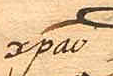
xpão
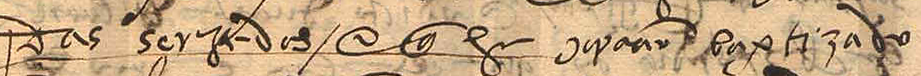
das serzedas / e que he xpaão baptizado
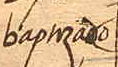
baptizado
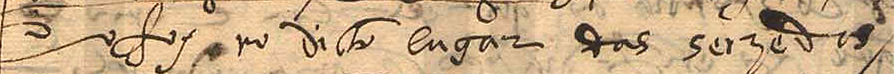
e o foy no dicto lugar das serzedas /
